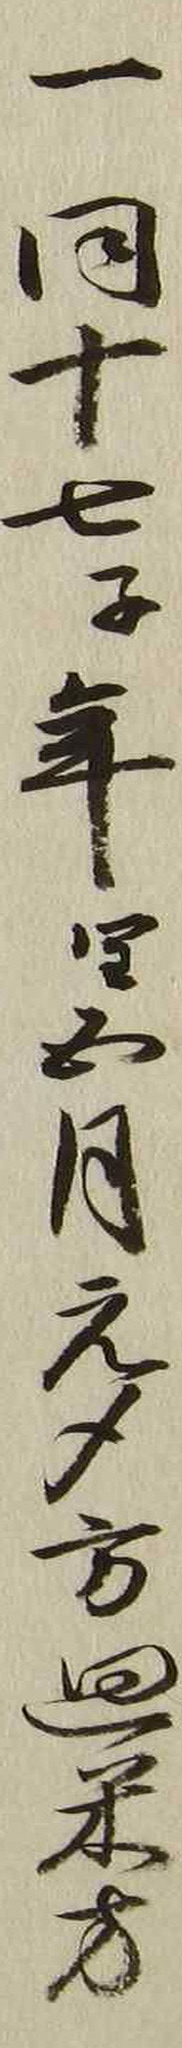一同十七子年閏五月元〆方廻米方
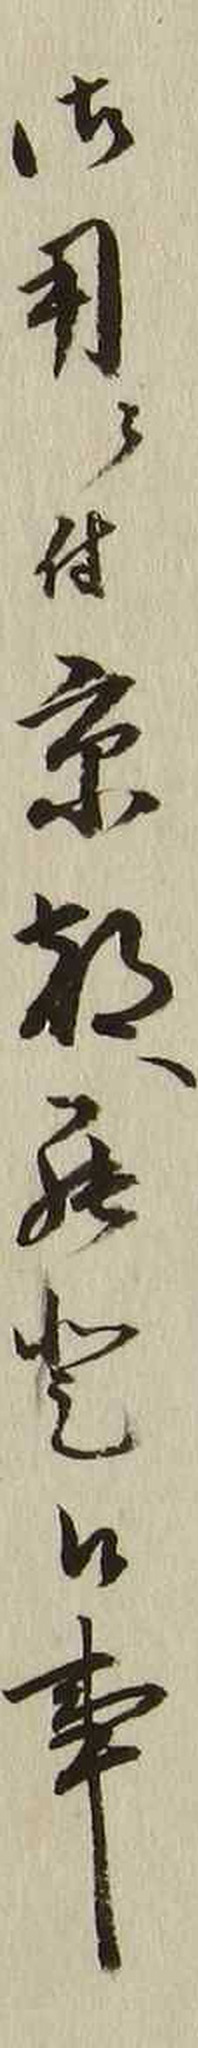御用ニ付京都へ罷登候事
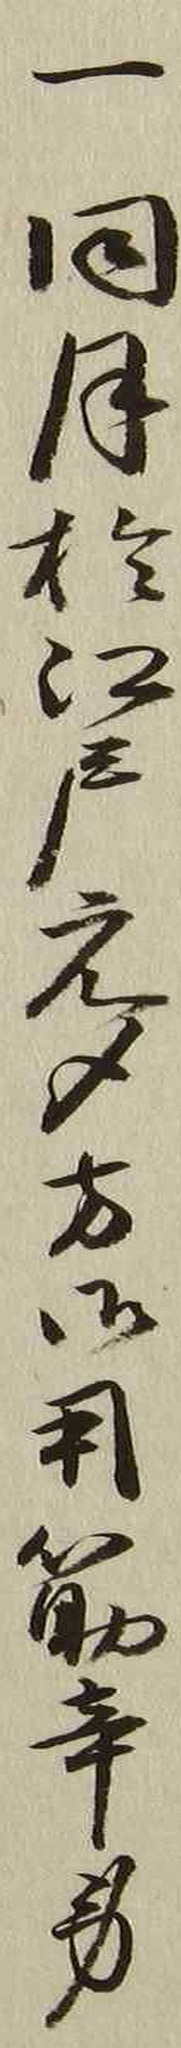一同月於江戸元〆方御用筋辛労
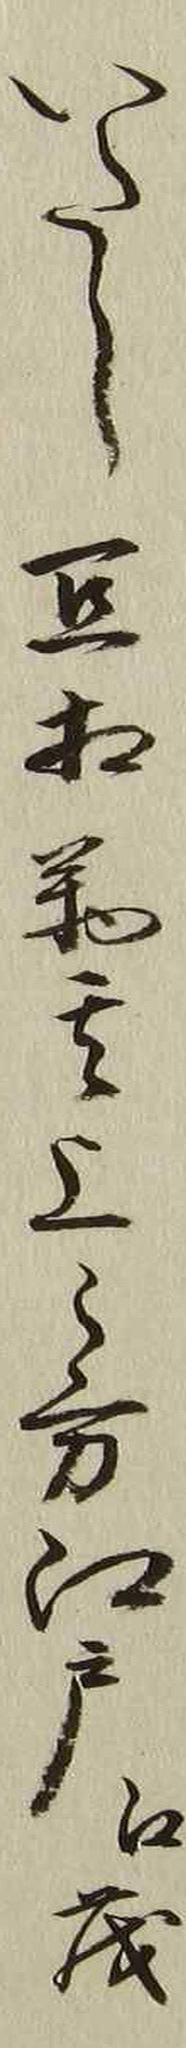いたし宜相勤其上々方江戸江も
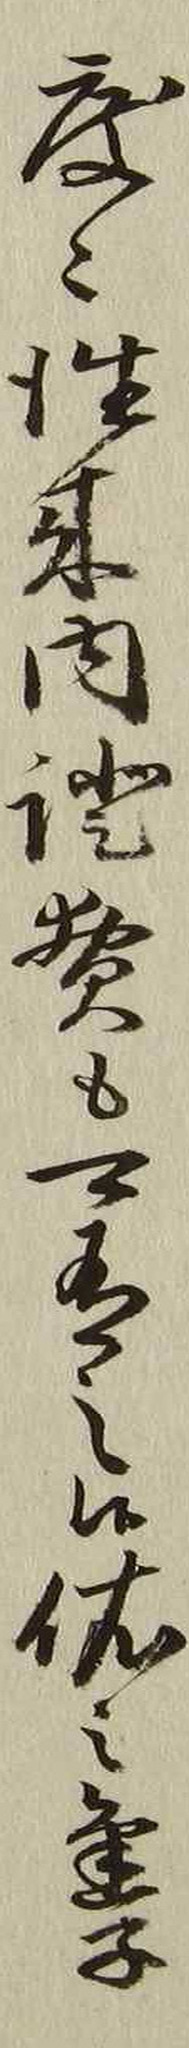度々往来内証費も可有之候依之金子
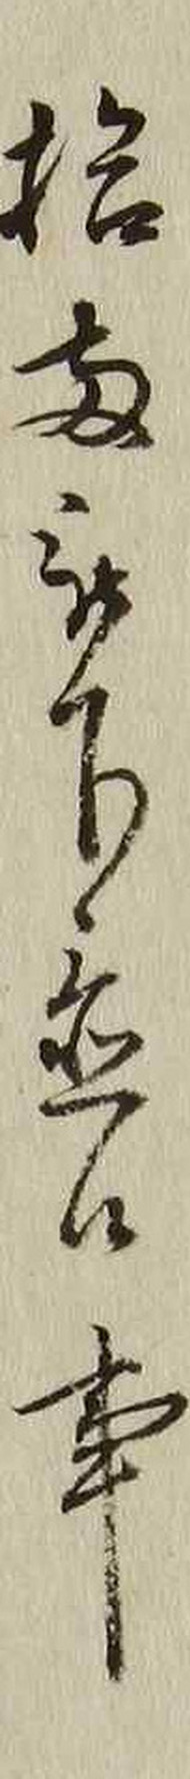拾両被下置候事
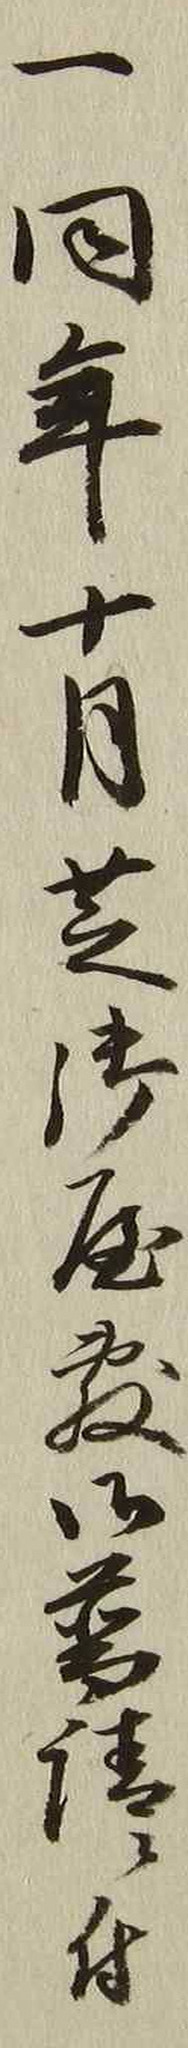一同年十月芝御屋敷御普請ニ付
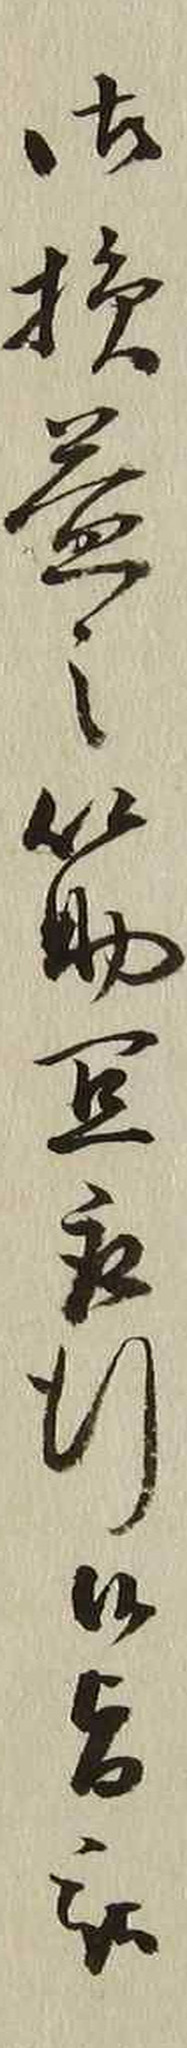御損益之筋宜取行候旨被
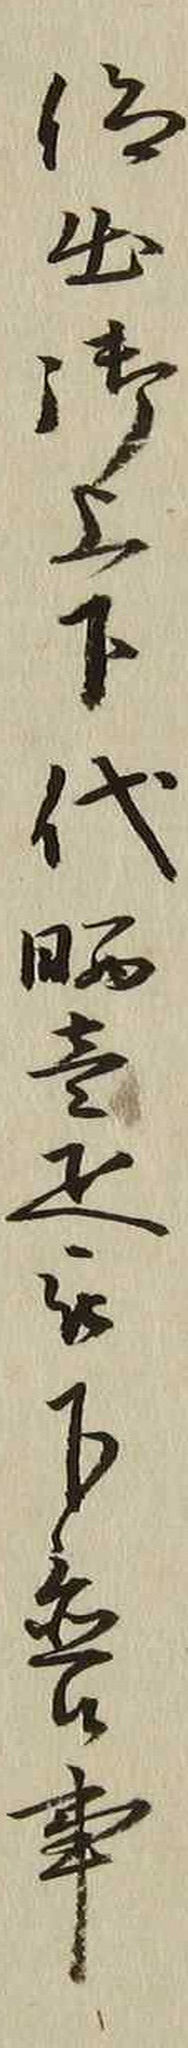仰出御上下代晒壱疋被下置候事
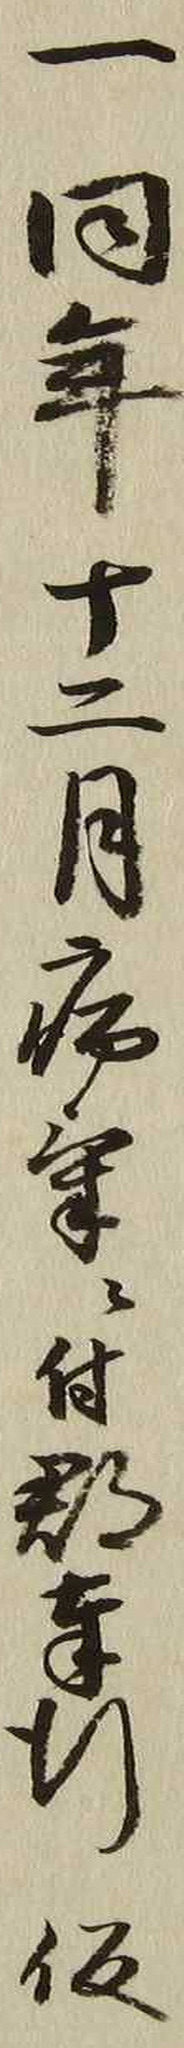一同年十二月病気ニ付郡奉行仮
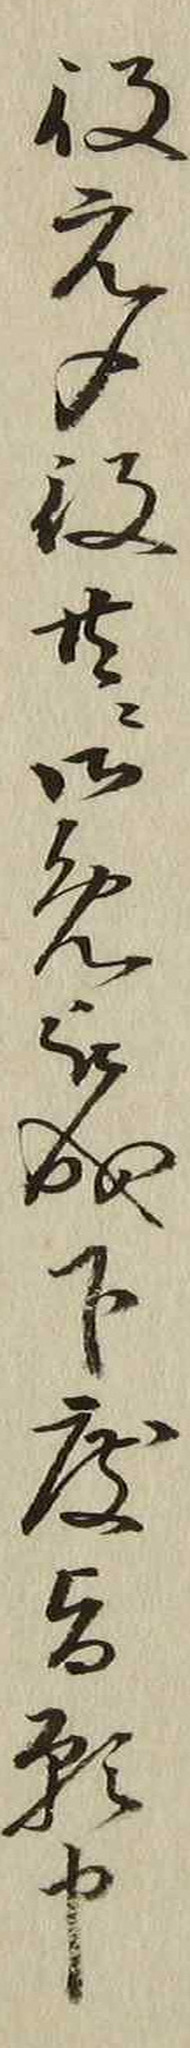役元〆役共ニ御免被成下度旨願申
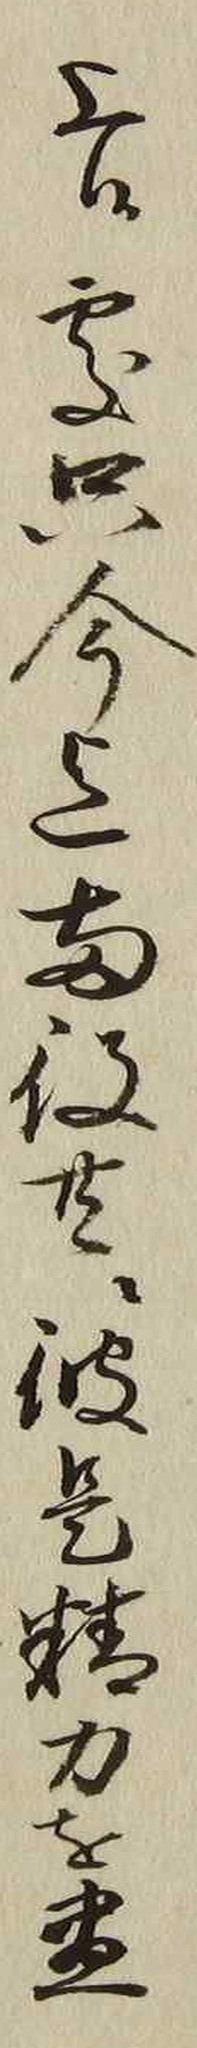上候処只今迄両役共ニ彼是精力を尽
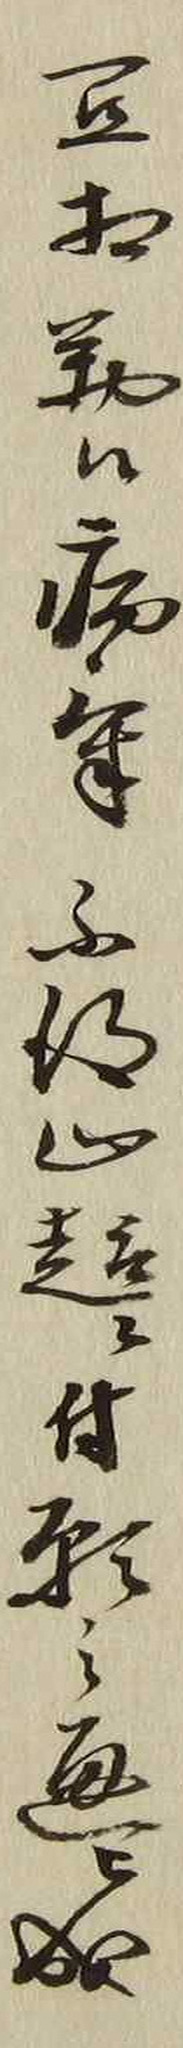宜相勤候病気不得止趣ニ付願之通被成
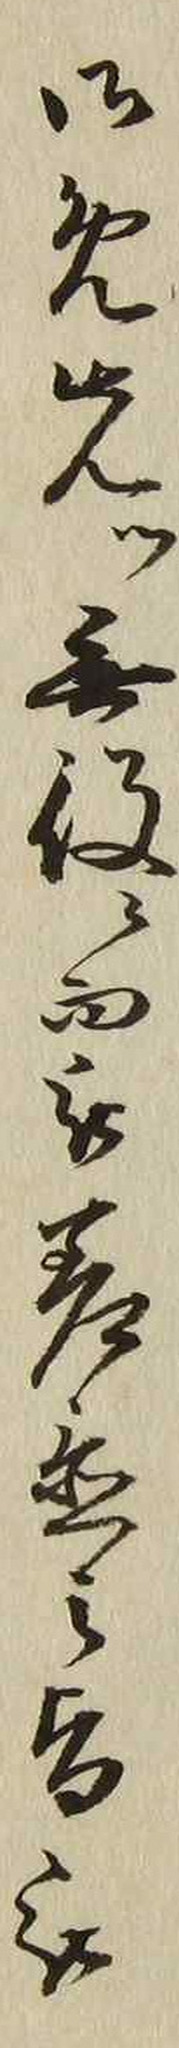御免先ツ無役ニ而被差置之旨被
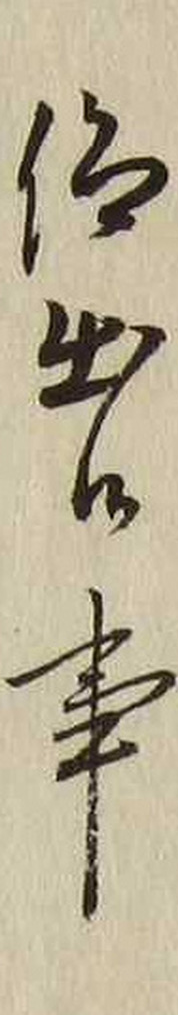仰出候事
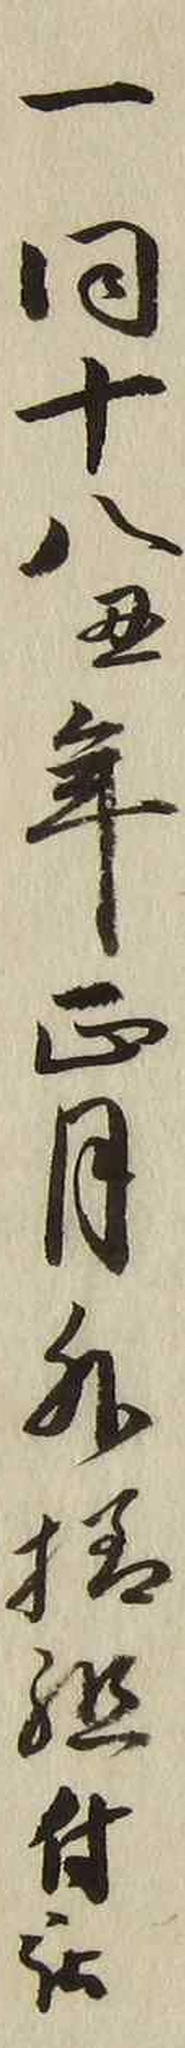一同十八丑年正月外様組付被
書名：諸士系譜　巻之61　と之部4
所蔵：会津若松市立会津図書館
